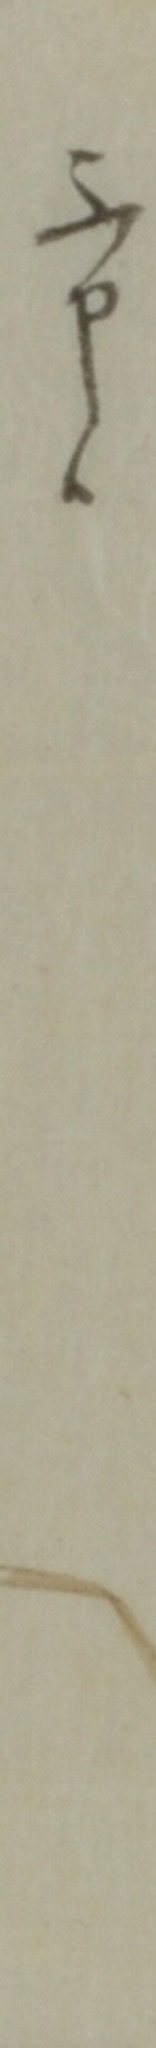不申候
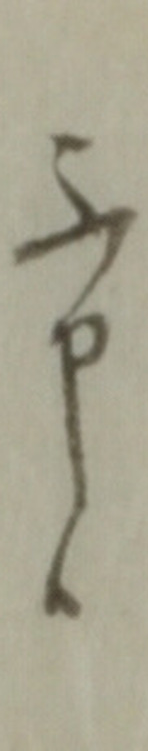不申候
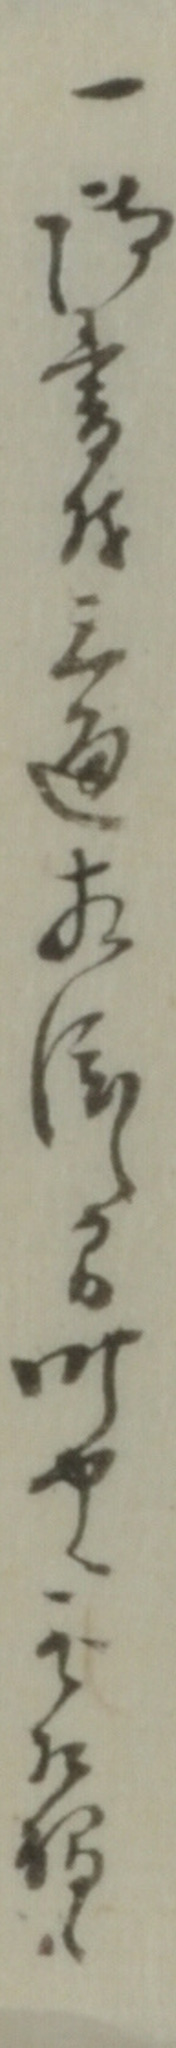一御書付三通相渡候間町中へ令相觸候
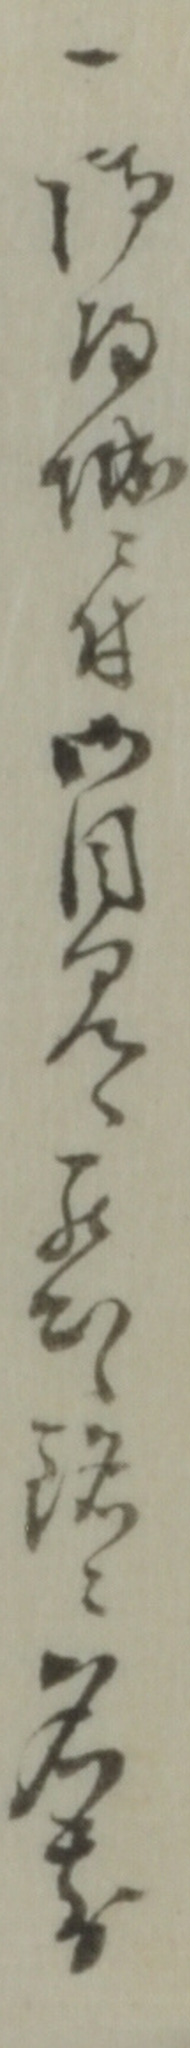一御帰城ニ不御目見ヘ罷出候銘々名前
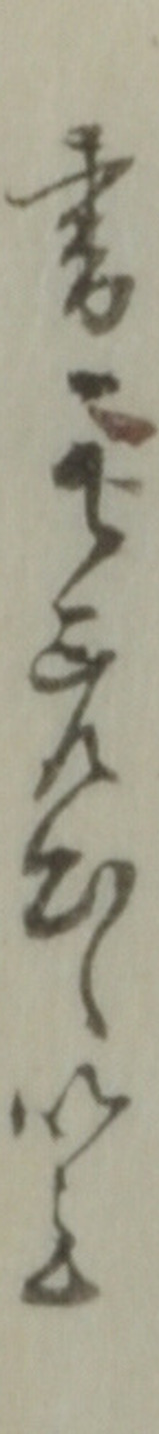書令差出候已上
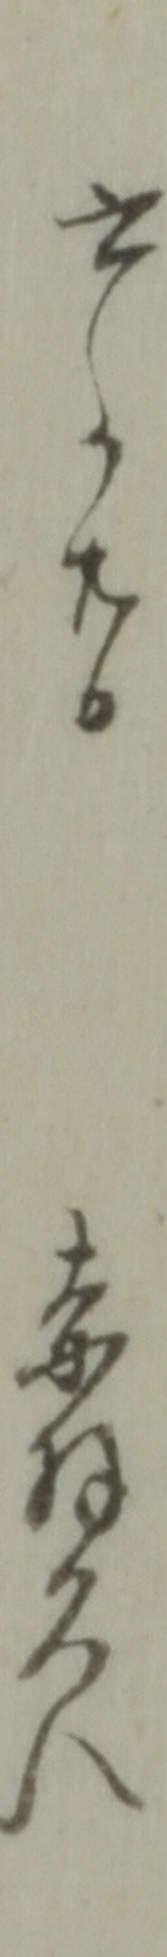六月廿日赤羽久八
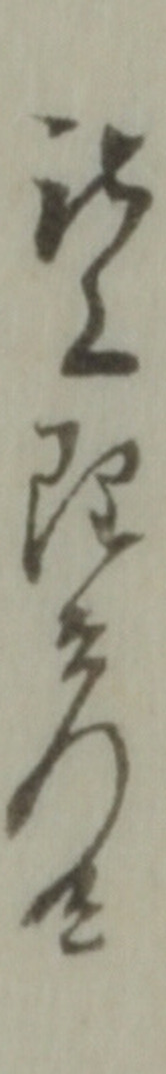池上利右衛門殿
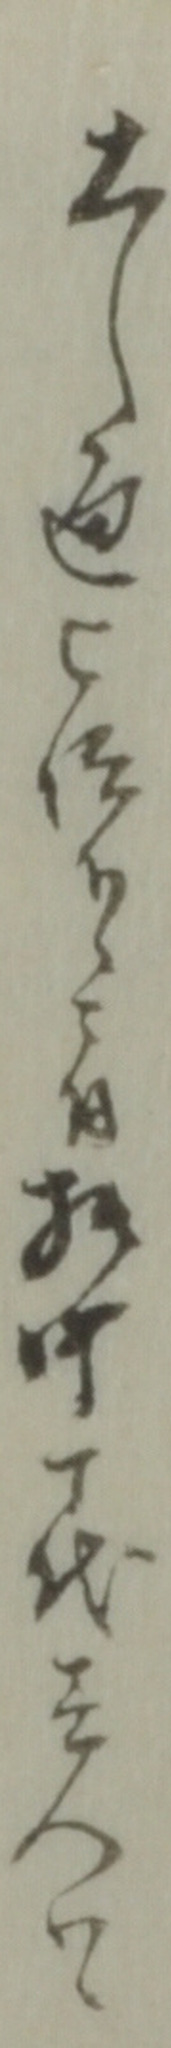右之通被仰下候ニ付村中丁代壱人ツヽ
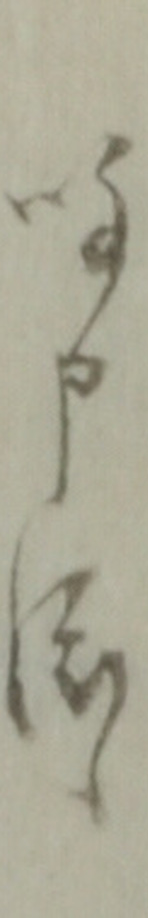呼申渡候
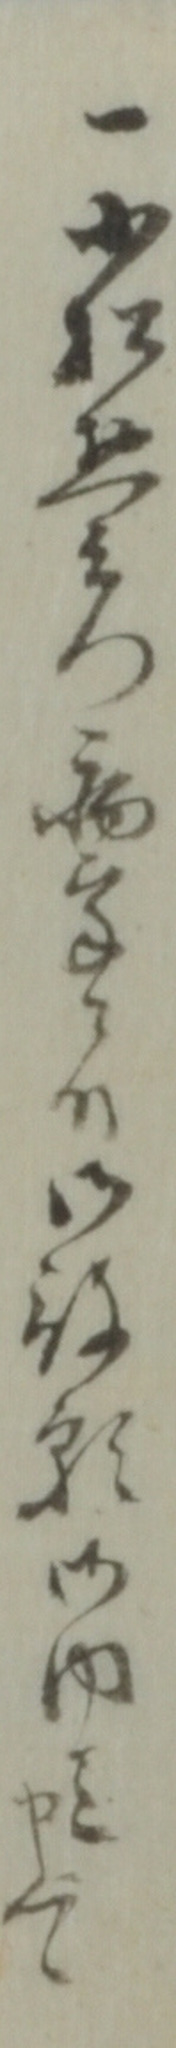一小松惣右衛門病気ニ付御役願御内意
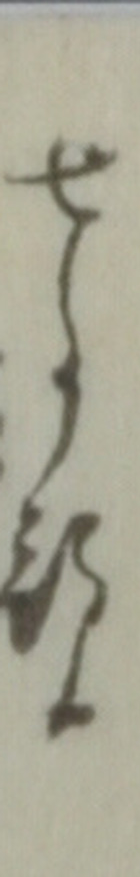七月朔日
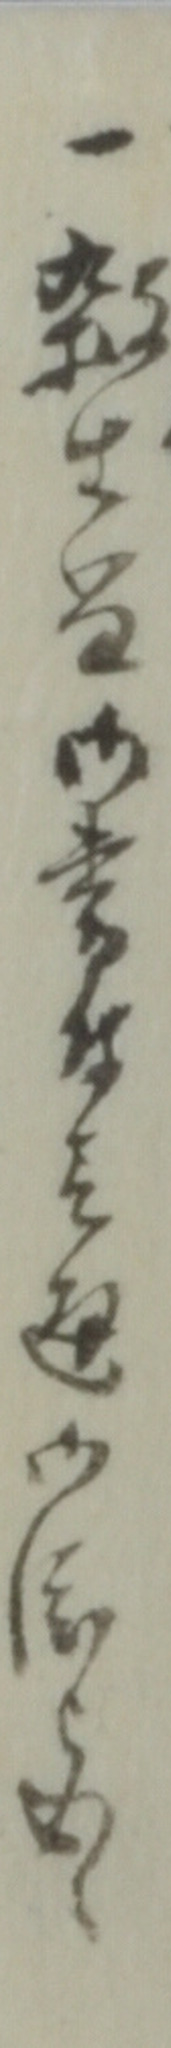一殺生留御書付壱通御渡被成候

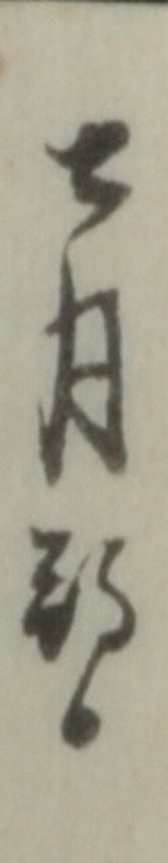七月朔日
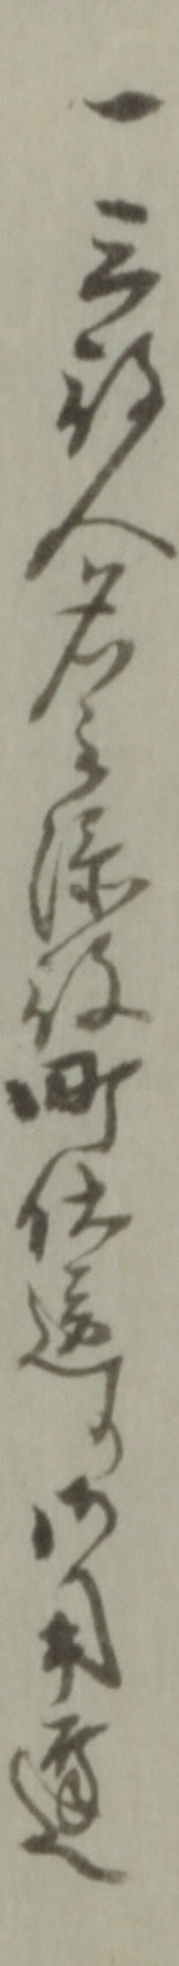一山役人名主添役町仕送リ御用達
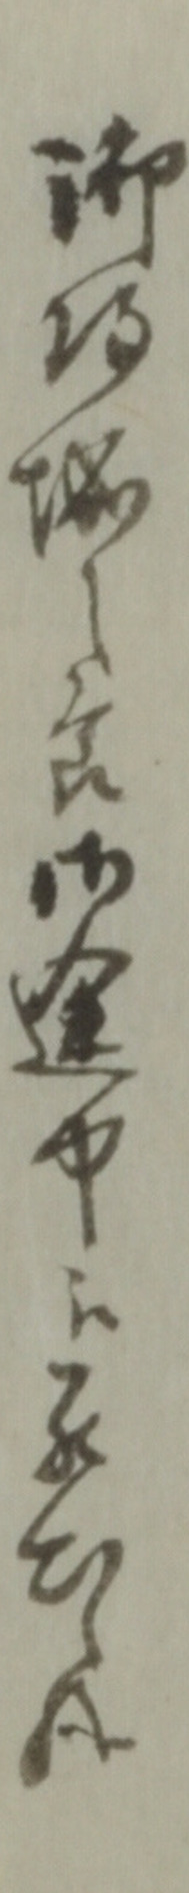御帰城之節御途中江罷出候様
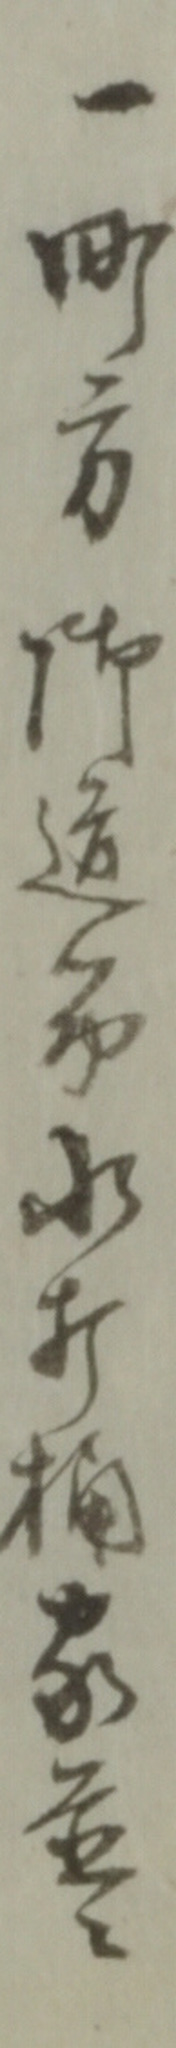一町方御道筋水打桶家置ニ
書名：御初入諸事控
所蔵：伊那市立高遠町図書館・合同会社AMANE
